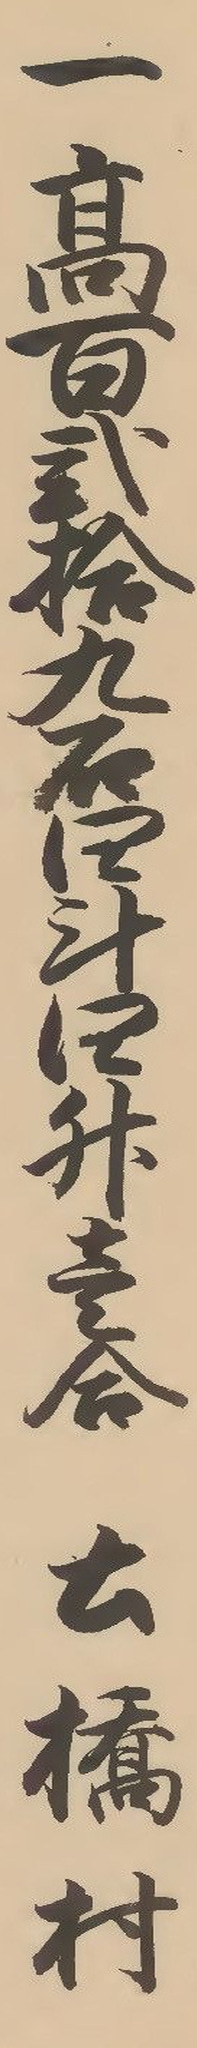一髙百弐拾九石四斗四升壱合土橋村
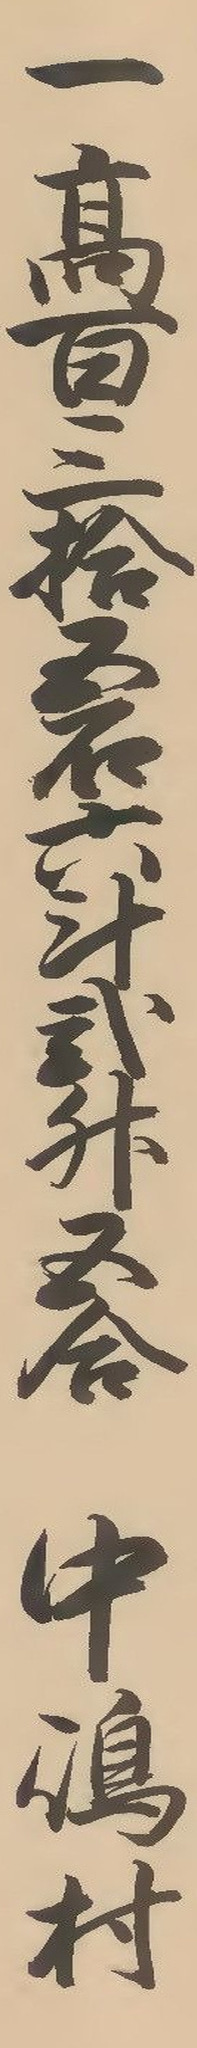一髙百三拾五石六斗弐升五合中嶋村
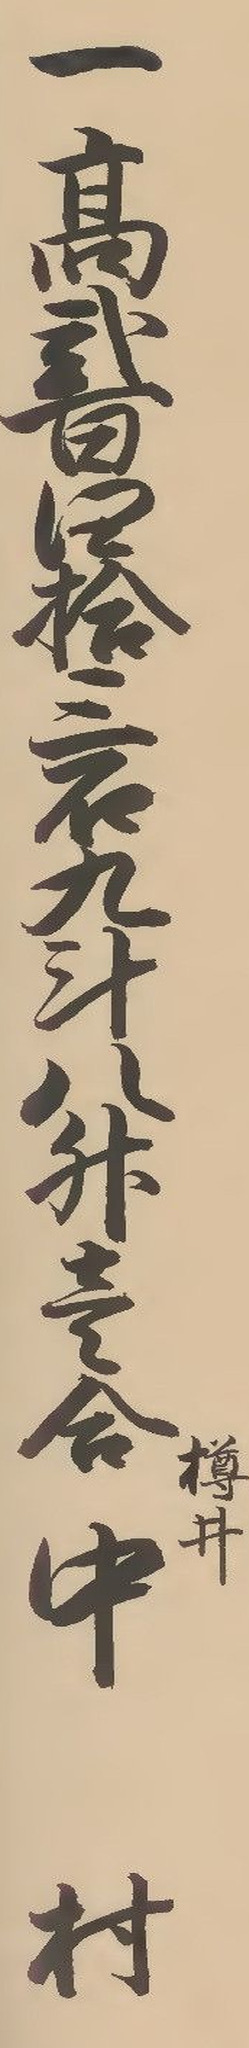一髙弐百四拾三石九斗八升壱合中村
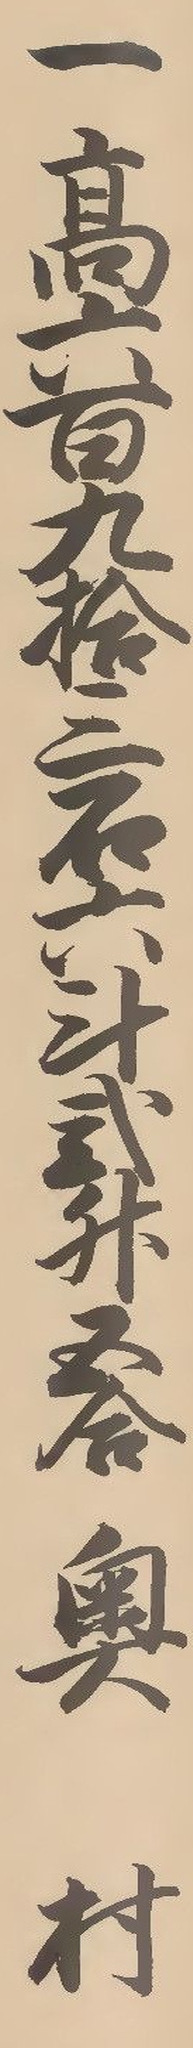一髙六百九拾三石六斗弐升五合奥村
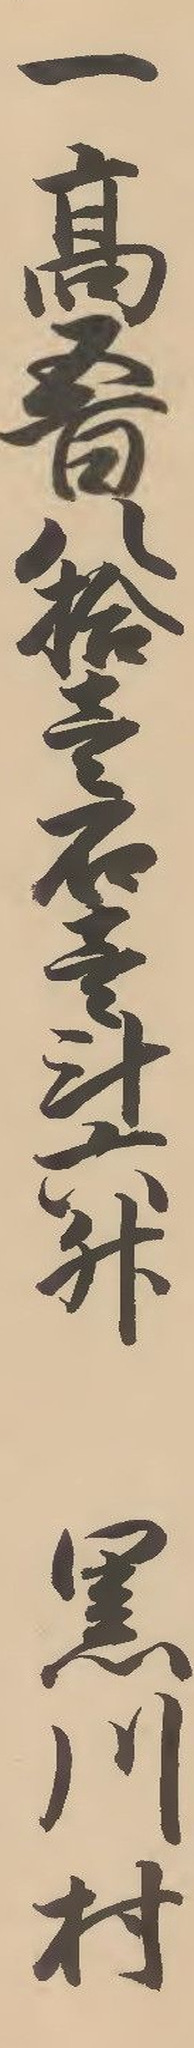一髙五百八拾壱石壱斗六升黑川村
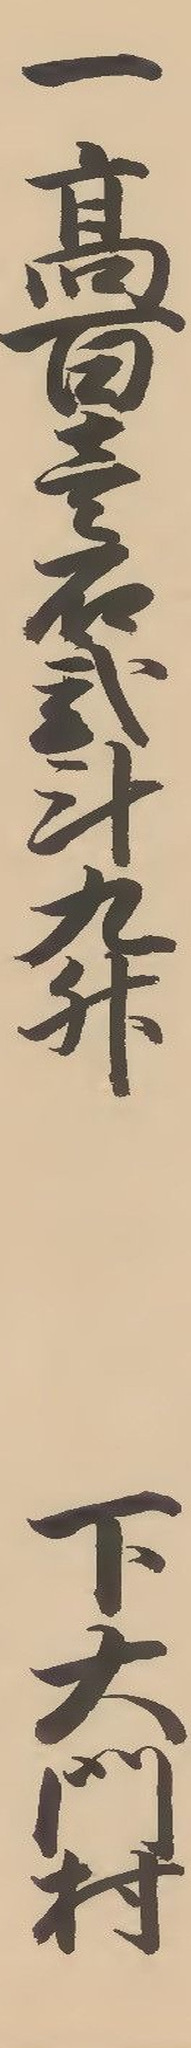一髙百壱石弐斗九升下大門村
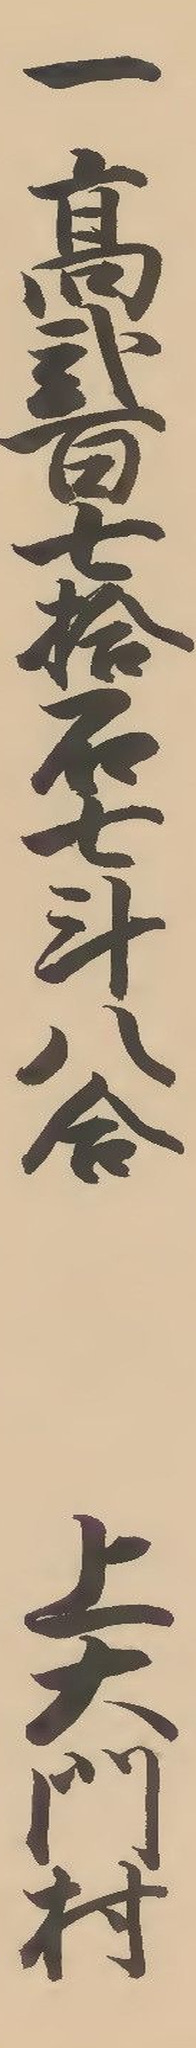一髙弐百七拾石七斗八合上大門村

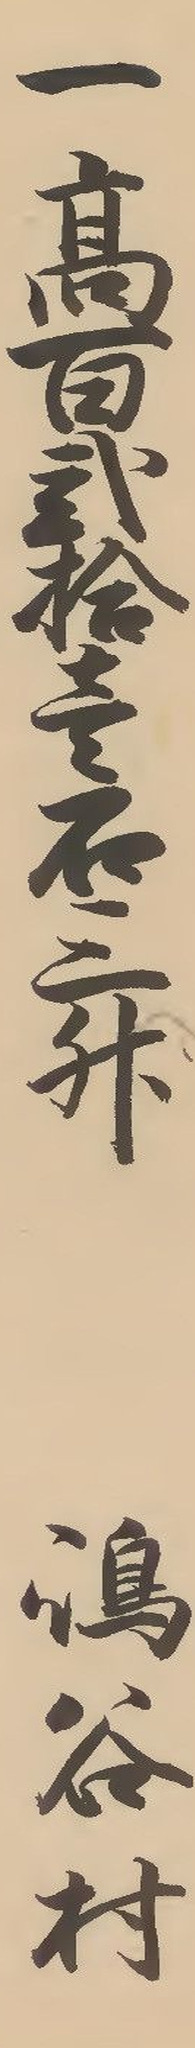一髙百弐拾壱石三升嶋谷村
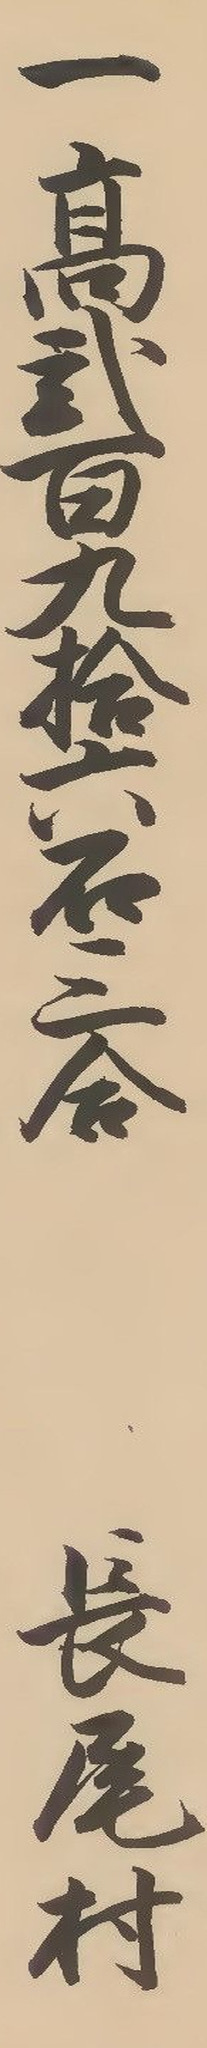一髙弐百九拾六石三合長尾村
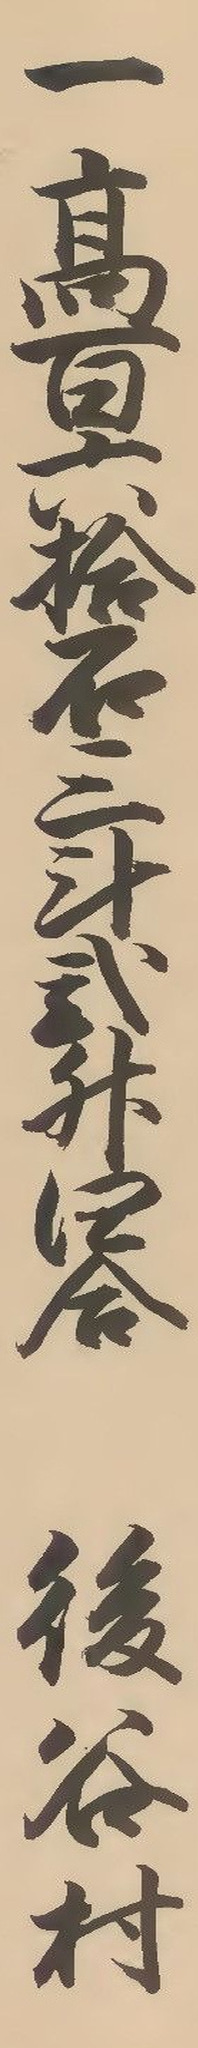一髙百六拾石三斗弐升四合後谷村
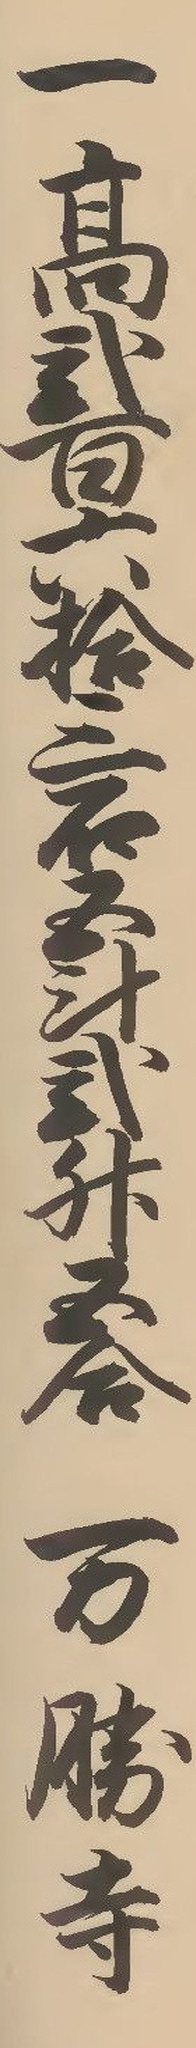一髙弐百六拾三石五斗弐升五合万勝寺
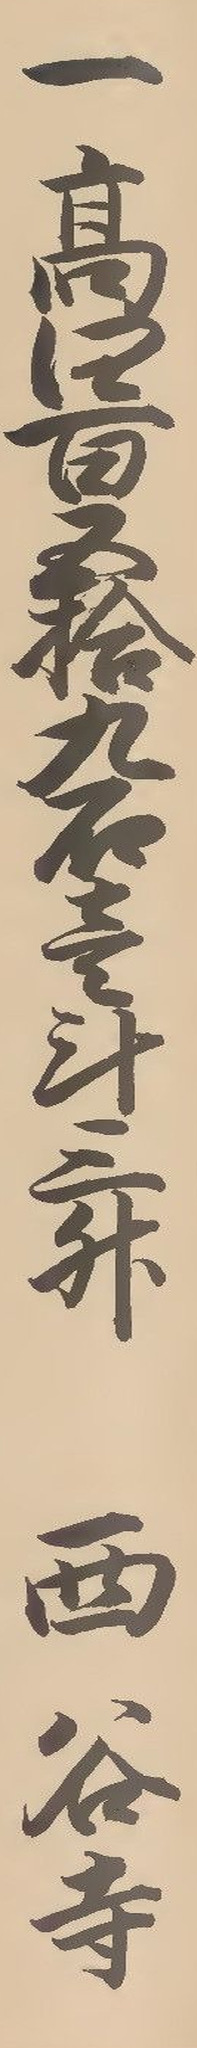一髙四百五拾九石壱斗三升西谷寺
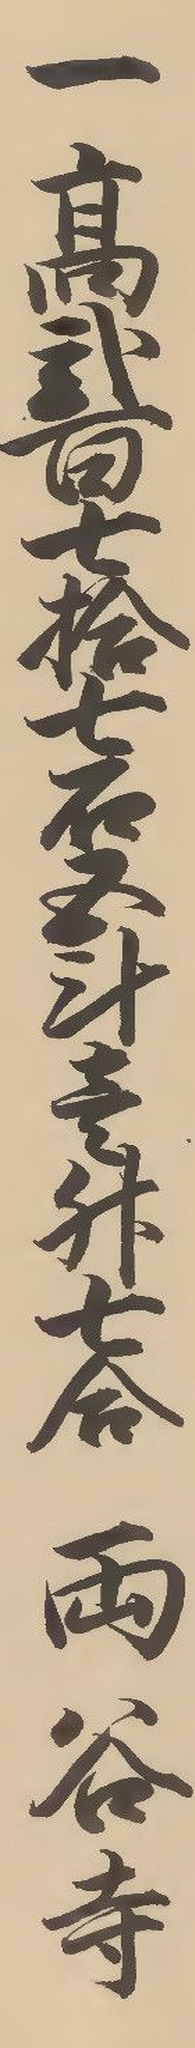一髙弐百七拾七石五斗壱升七合両谷寺
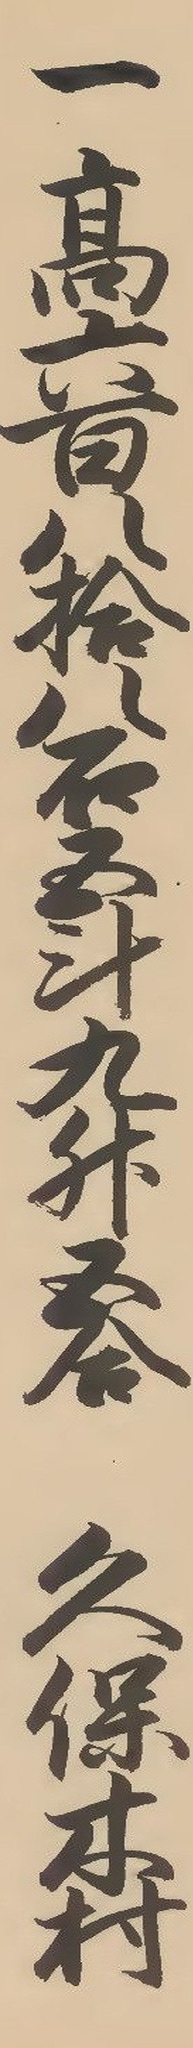一髙六百八拾八石五斗九升五合久保木村
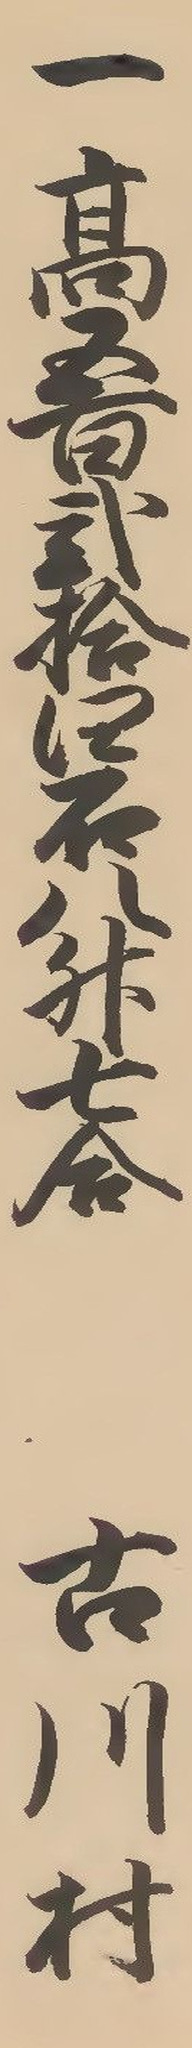一髙五百弐拾四石八升七合古川村

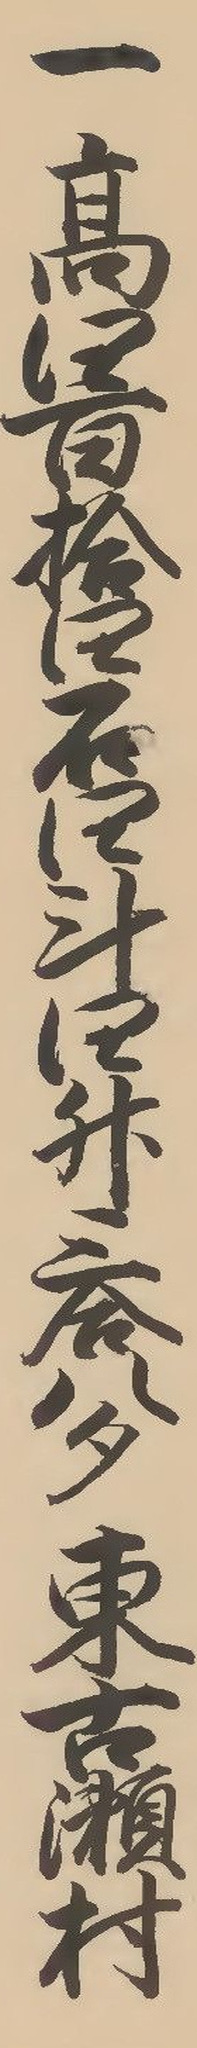一髙四百拾四石四斗四升三合八夕東古瀬村
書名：播磨国郷帳
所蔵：国立公文書館 National Archives of Japan
